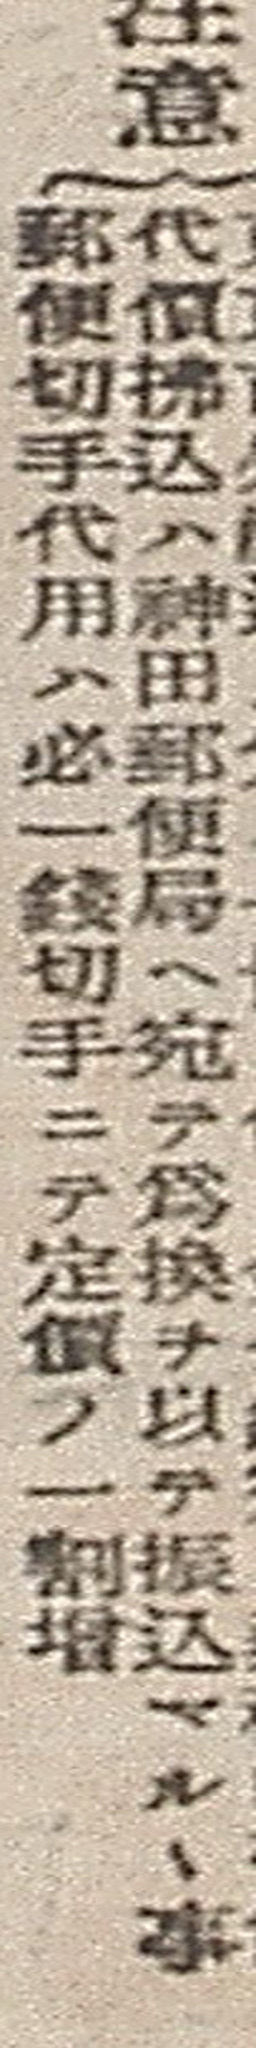郵便切手代用ハ必一銭切手ニテ定価ノ一割増
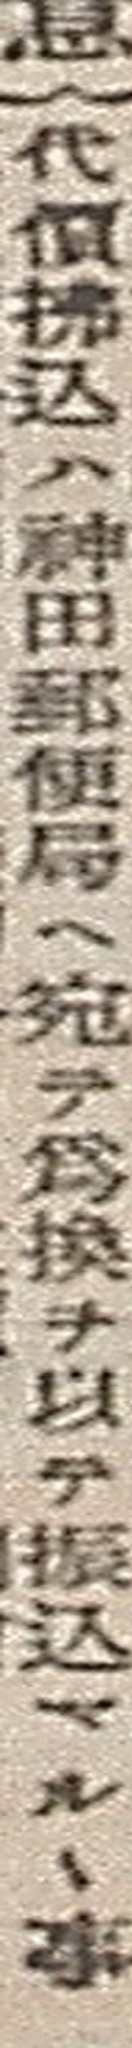代価払込ハ神田郵便局ヘ宛テ為換ヲ以テ振込マルヽ事
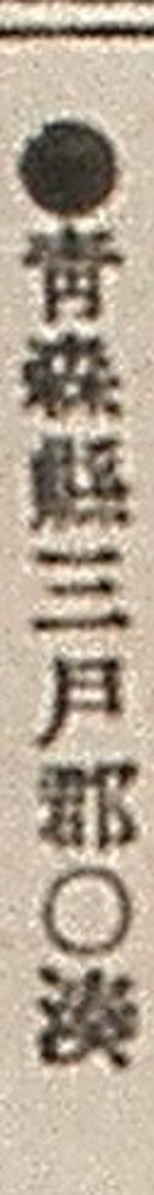●青森県三戸郡〇湊
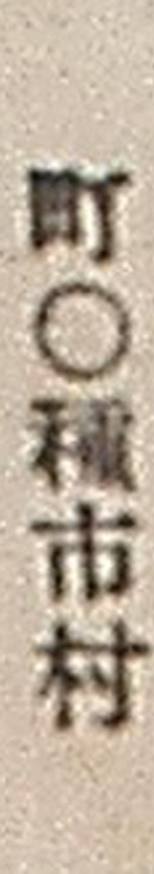町〇種市村
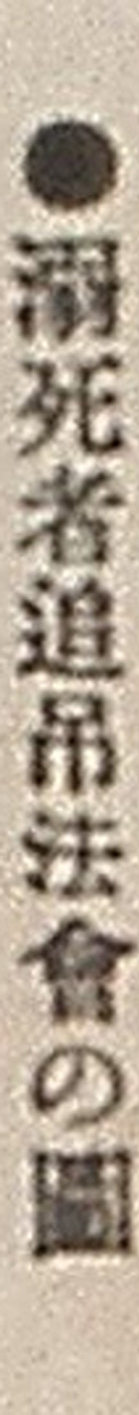●溺死者追吊法会の図
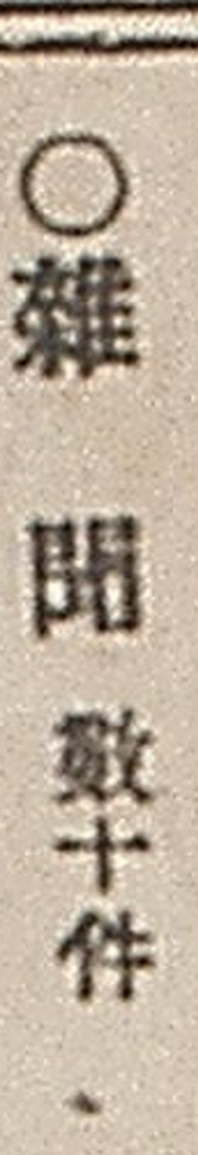〇雑聞数十件
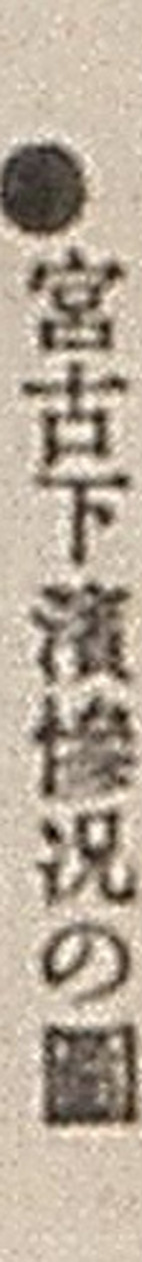●宮古下浜惨況の図
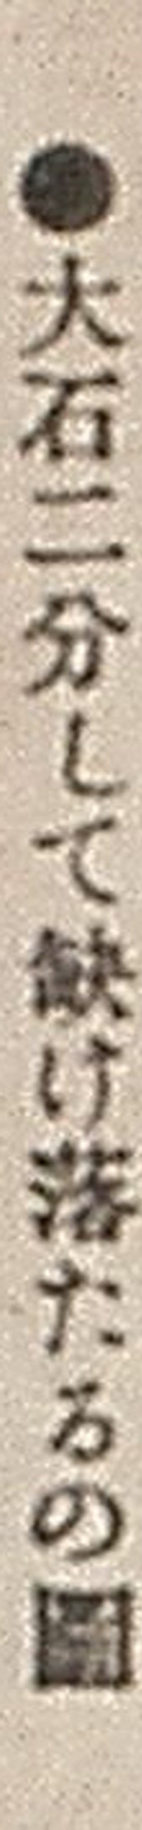●大石二分して缺け落たるの図
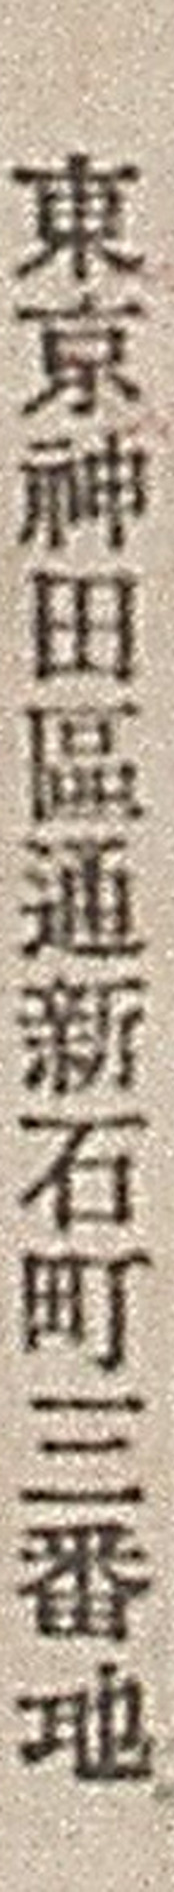東京神田区通新石町三番地
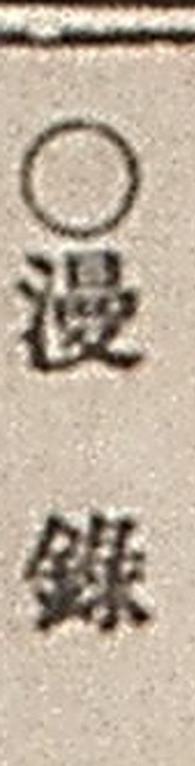〇漫録
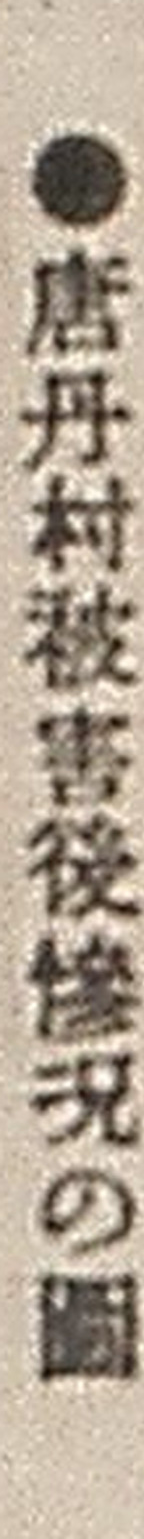●唐丹村被害後惨況の図
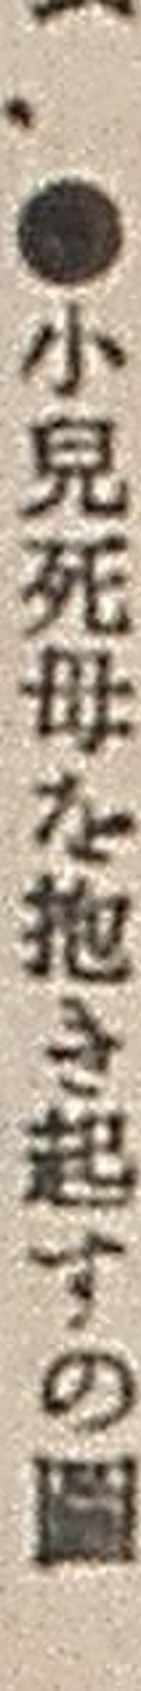●小児死母を抱き起すの図
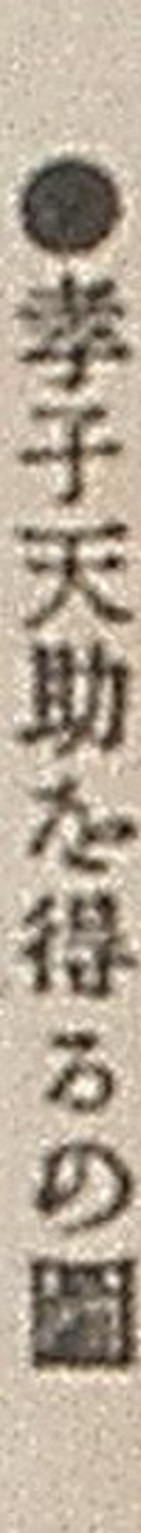●孝子天助を得るの図
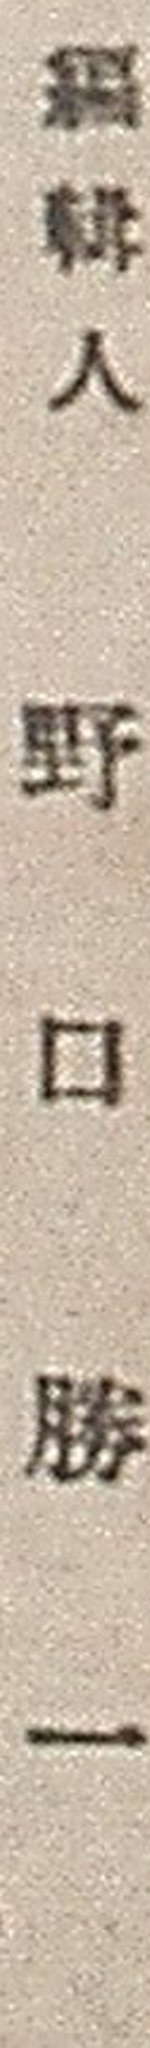編集人野口勝一
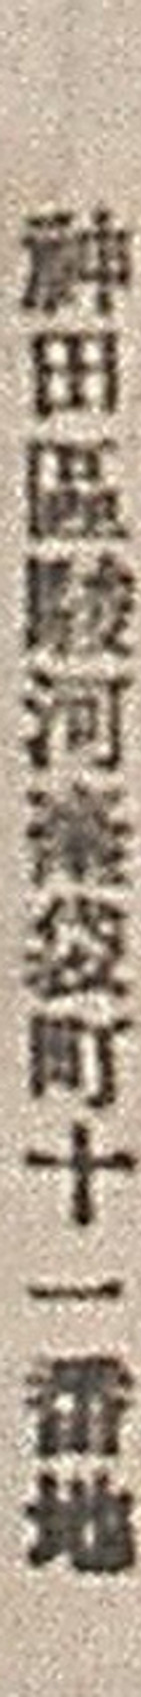神田区駿河台袋町十一番地
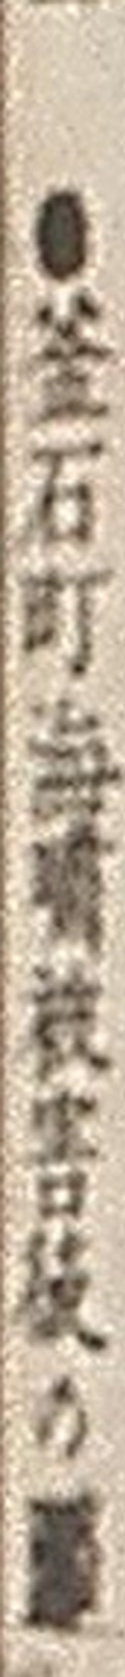●釜石町海嘯被害後の図
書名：風俗畫報臨時増刊第百二十號　大海嘯被害録（下）
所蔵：東京大学地震研究所図書室 Earthquake Research Institute Library, The University of Tokyo, JAPAN
